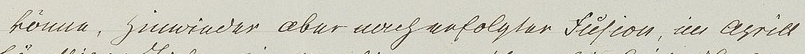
könne, hinwieder aber nach erfolgter Fusion, im Aprill
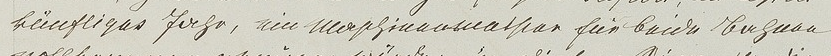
künftiges Jahr, ein Maschinenmeister für beide Bahnen
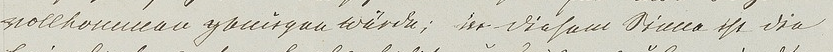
vollkommen genügen würde; in diesem Sinne ist die
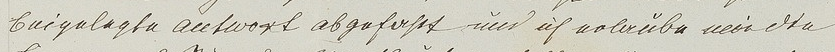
beigelegte Antwort abgefasst und ich erlaube mir die
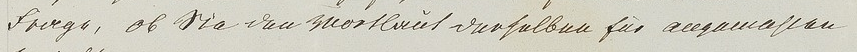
Frage, ob Sie den Wortlaut derselben für angemessen
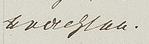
erachten.
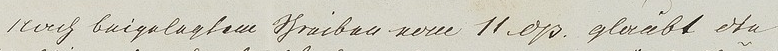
Nach beigelegtem Schreiben vom 11 dß. glaubt die
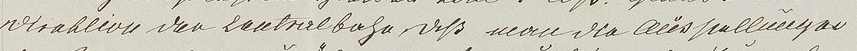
Direktion der Centralbahn, daß man die Ausstellungen
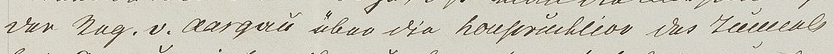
der Reg. v. Aargau über die Konstrucktion des Tunnels
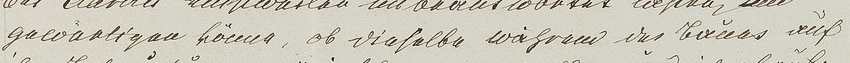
gewärtigen könne, ob dieselbe während des Baues auf
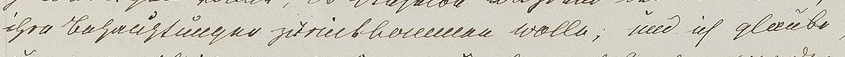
ihre Behauptungen zurückkommen wolle, und ich glaube,
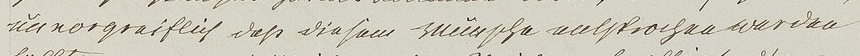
unvorgreiflich, daß diesem Wunsche entsprochen werden
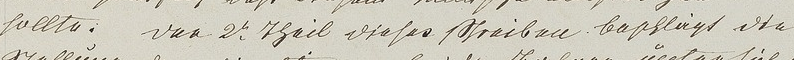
sollte. Der 2te Theil dieses Schreiben beschlägt die
